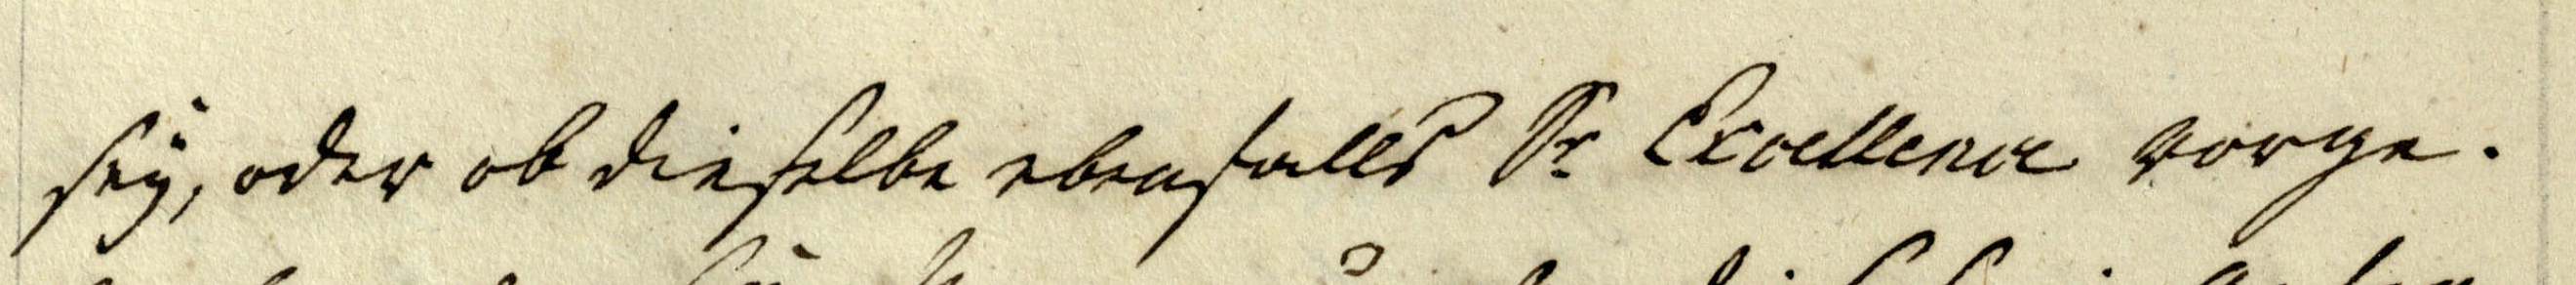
seÿ, oder ob dieselbe ebenfalls Sr Excellence vorge¬
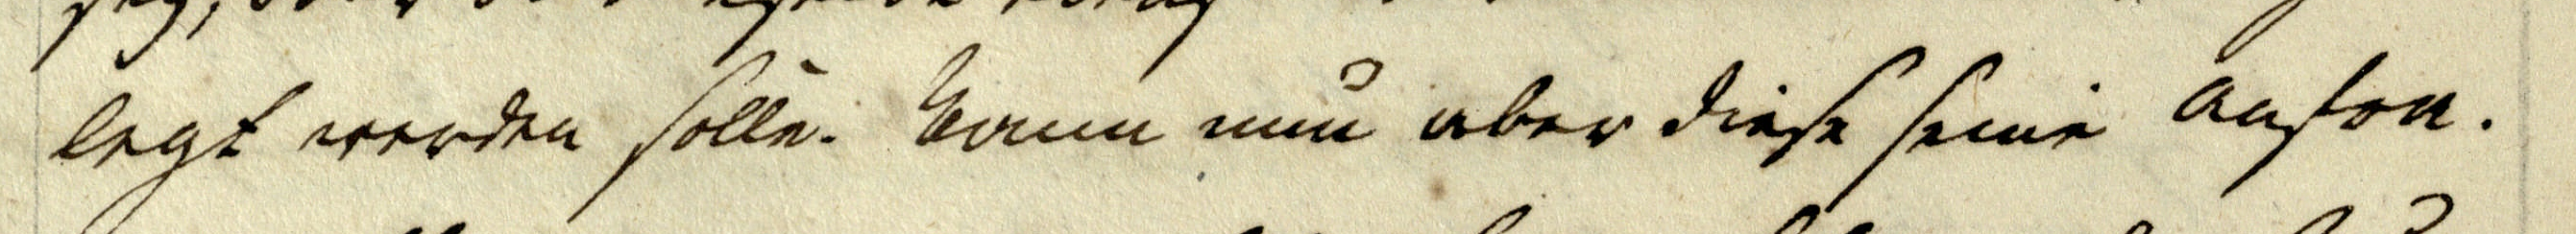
legt werden solle. Wann nun aber diese seine Anfra¬
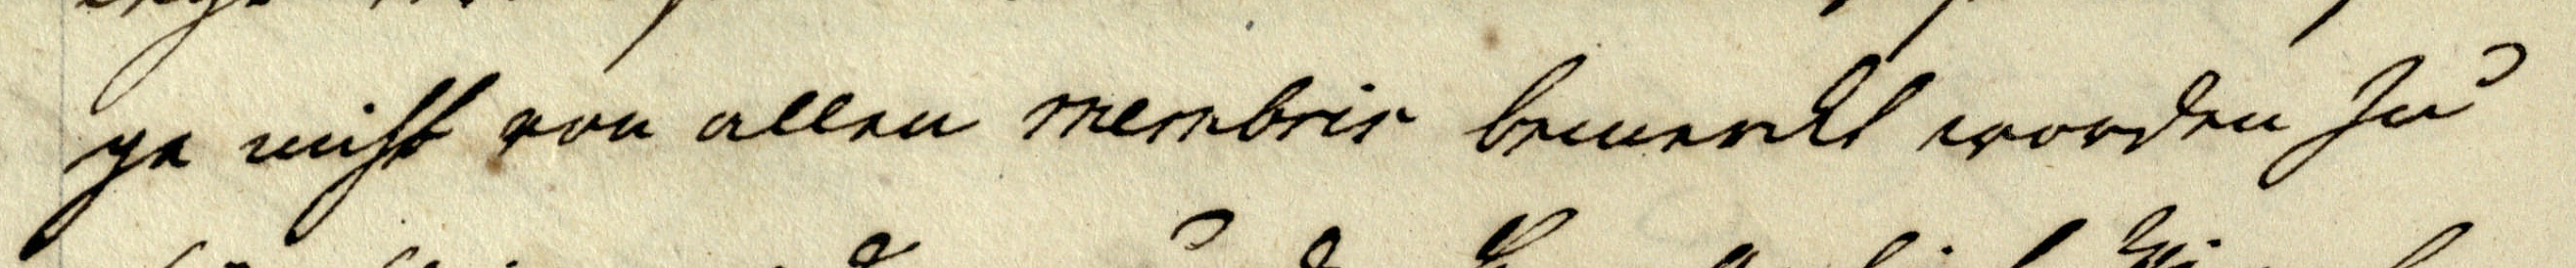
ge nicht von allen membris bemerckt worden zu
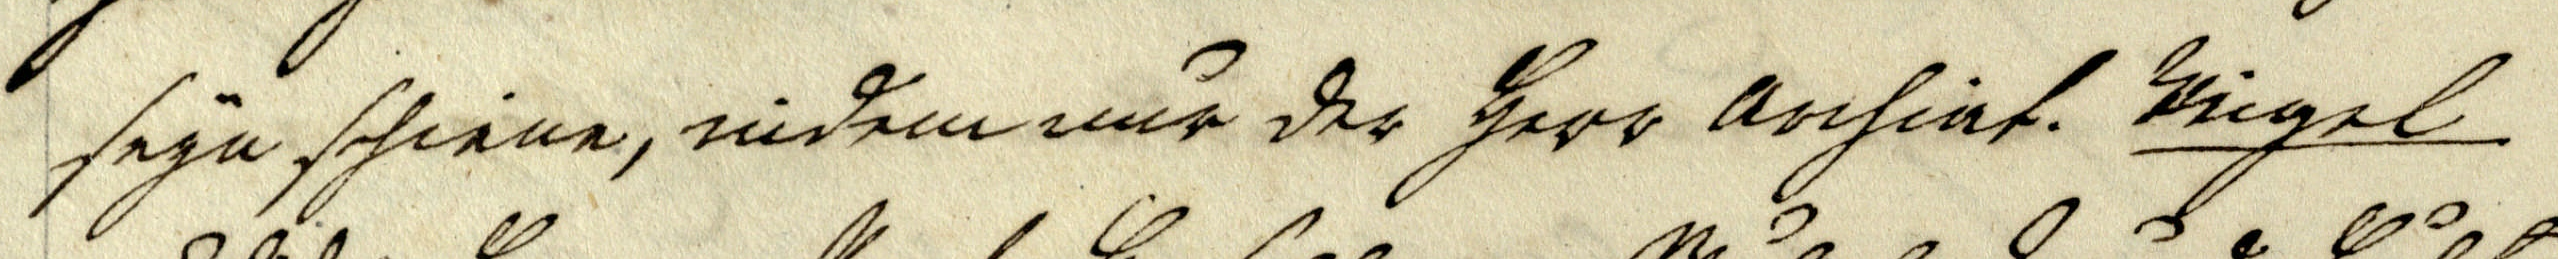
seÿn schiene, indem nur der Herr Archiat. Weigel
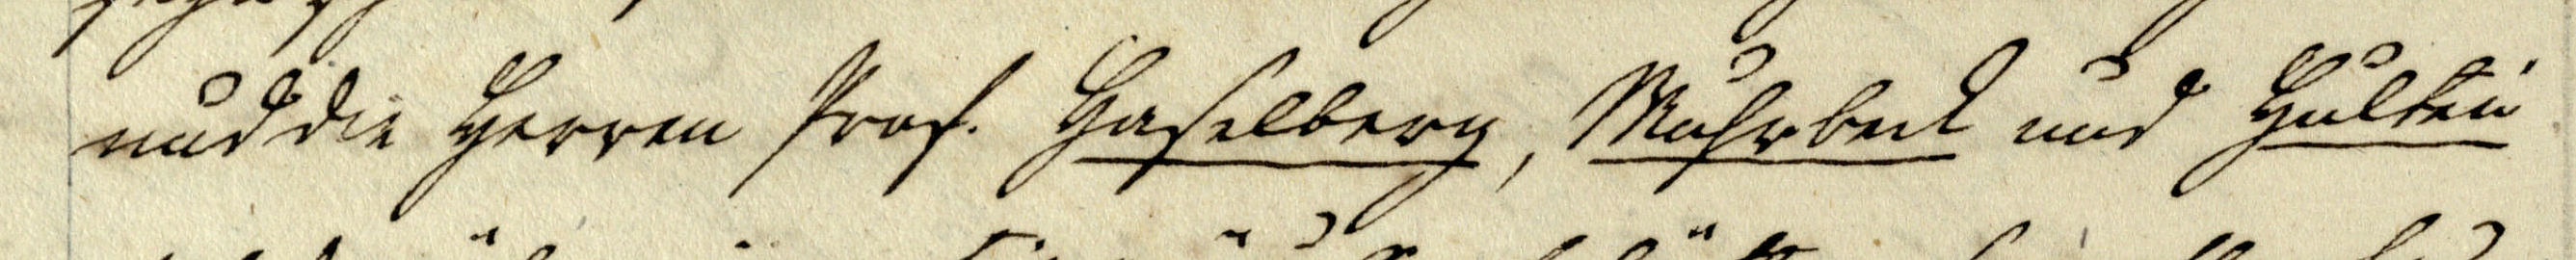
und die Herren Prof. Haselberg, Muhrbeck und Hultén
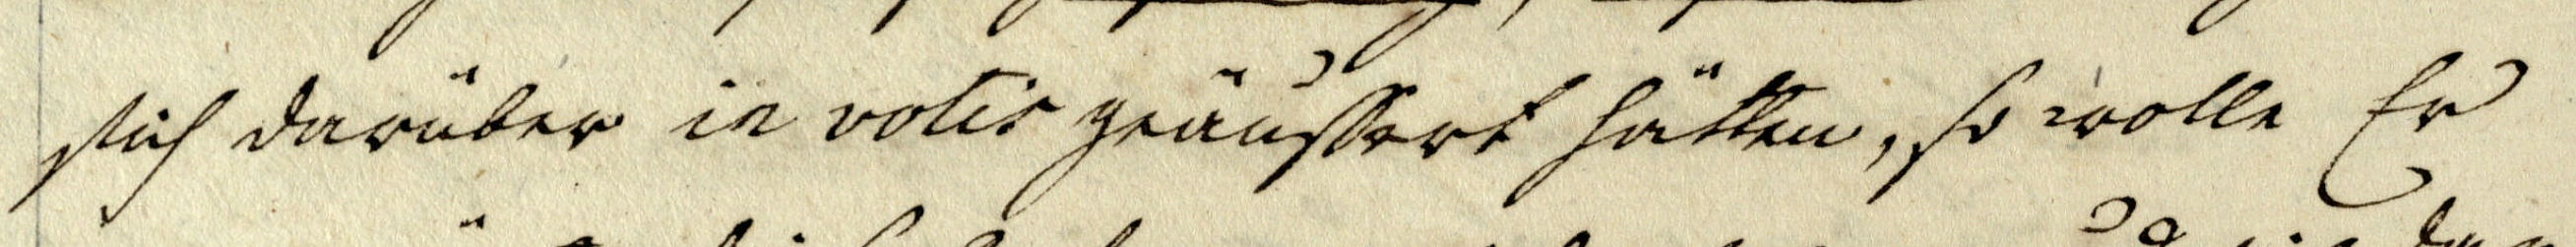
sich darüber in votis geäussert hätten, so wolle Er
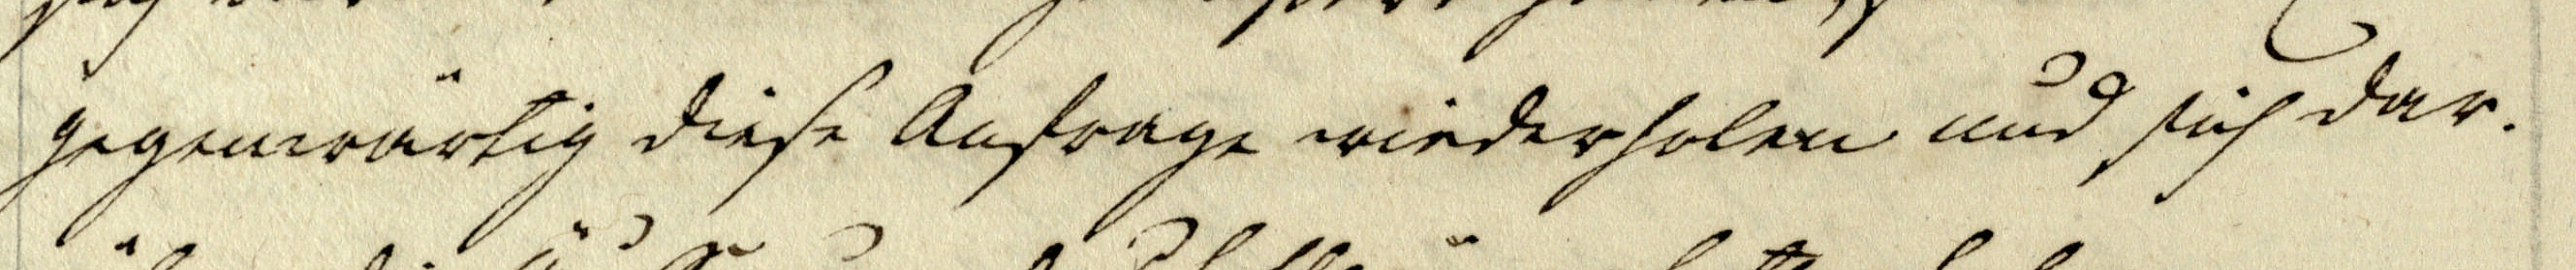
gegenwärtig diese Anfrage wiederholen und sich dar¬
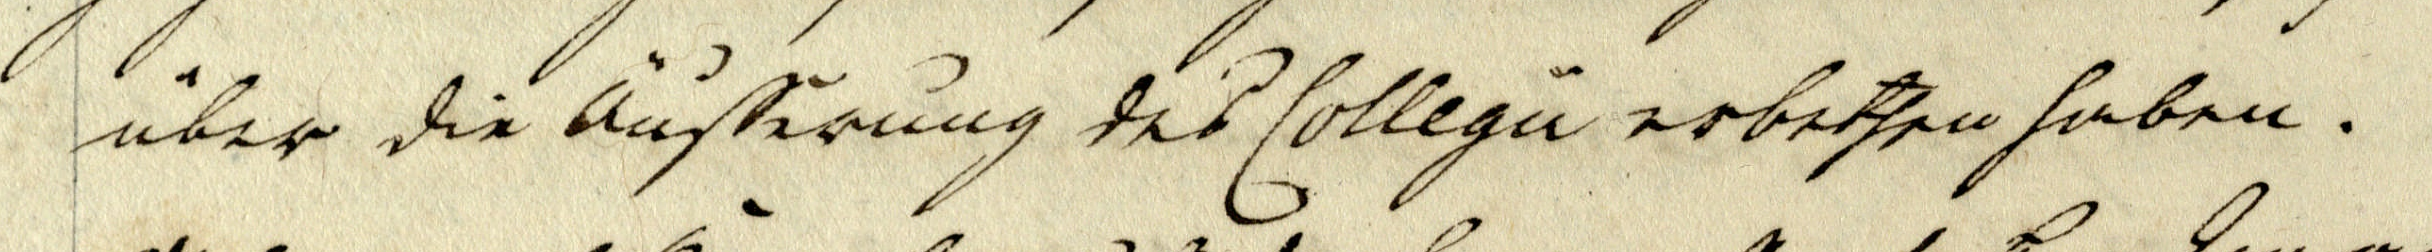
über die Äusserung des Collegii erbethen haben.
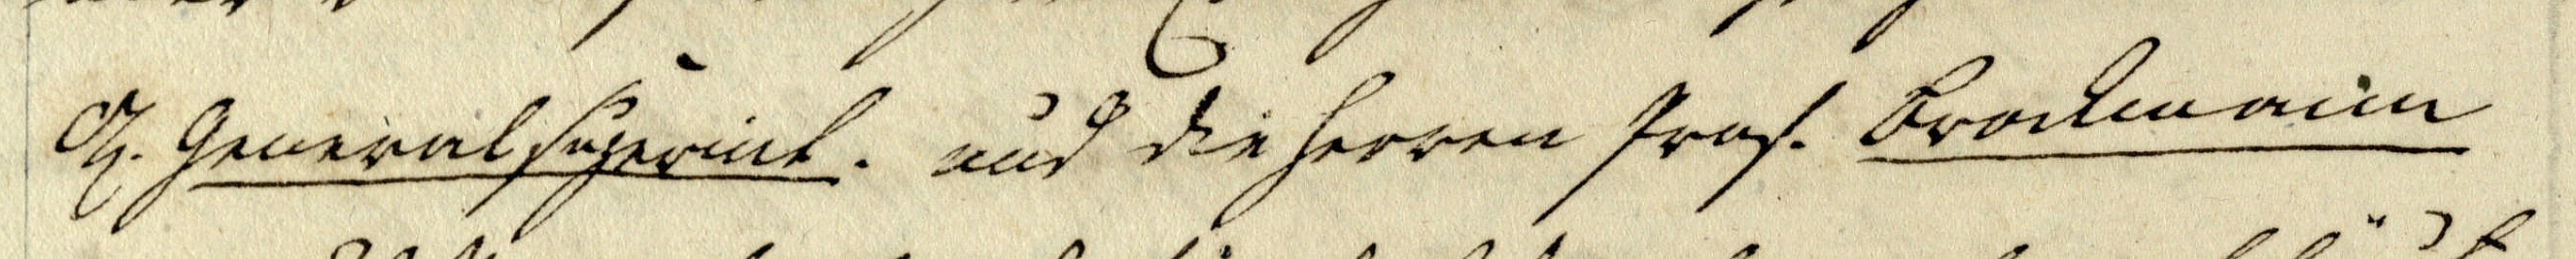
dh. Generalsuperint. und die Herren Prof. Brockmann
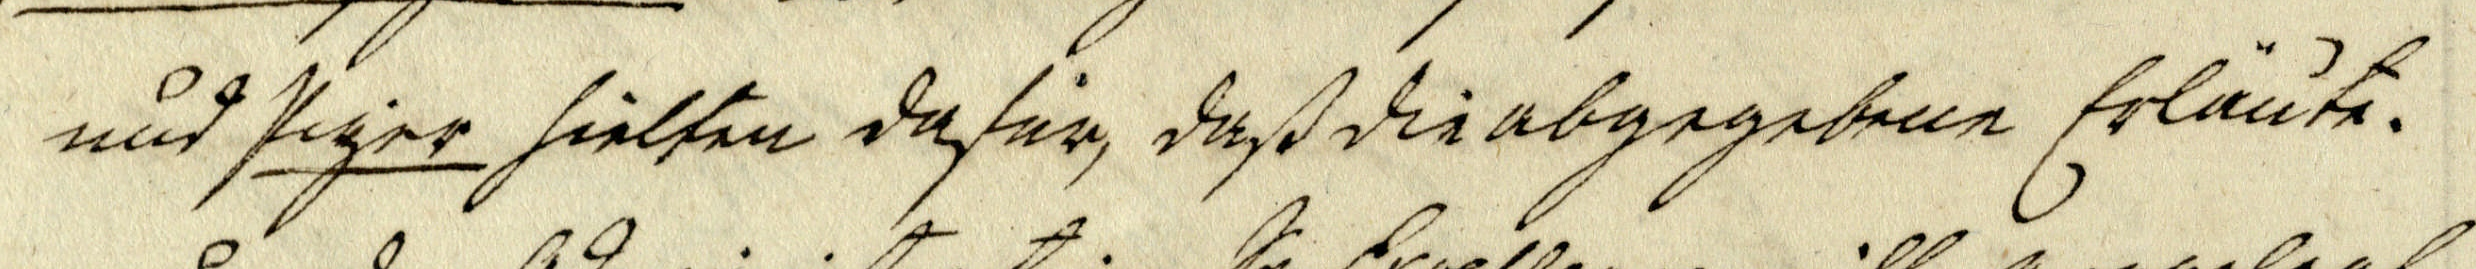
und Piper hielten dafür, daß die abgegebene Erläute¬
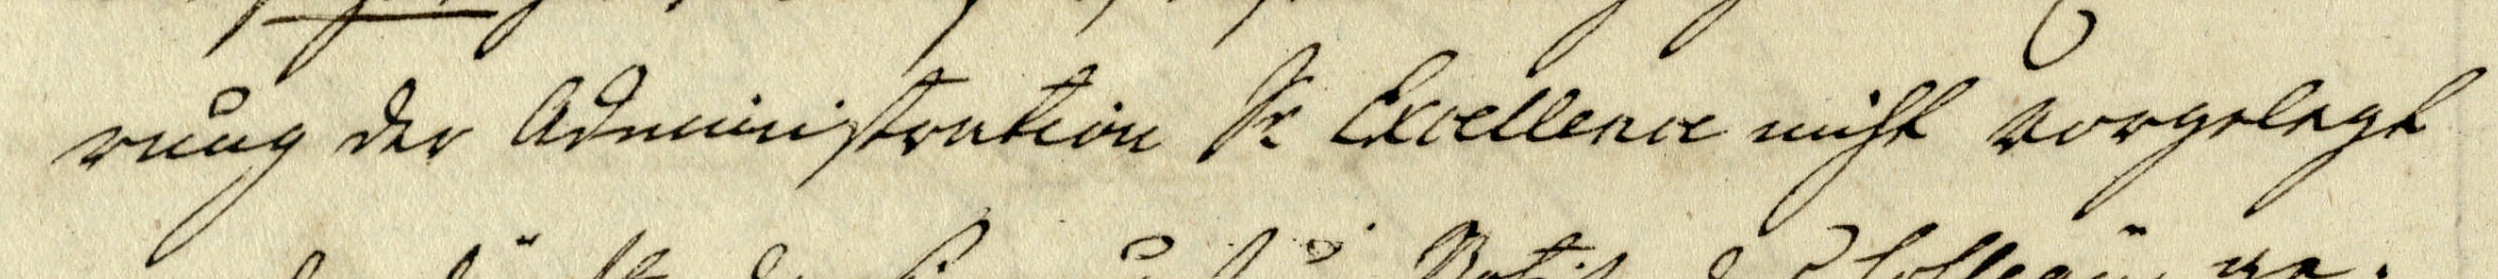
rung der Administration Sr Excellence nicht vorgelegt
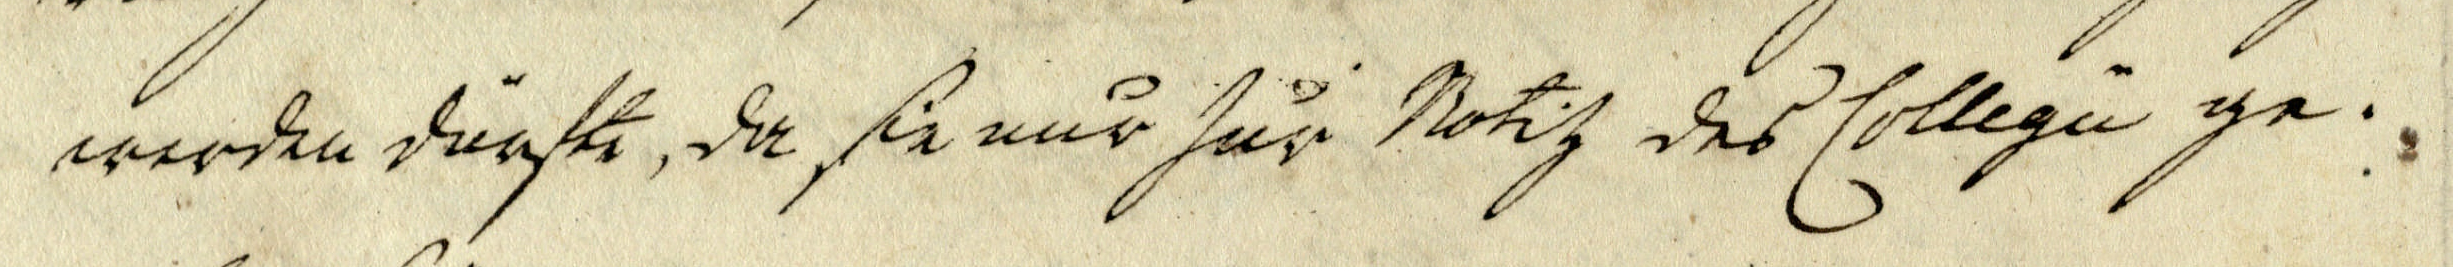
werden dürfte, da sie nur zur Notiz des Collegii ge¬
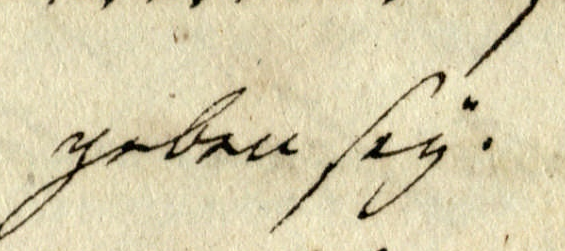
geben seÿ.
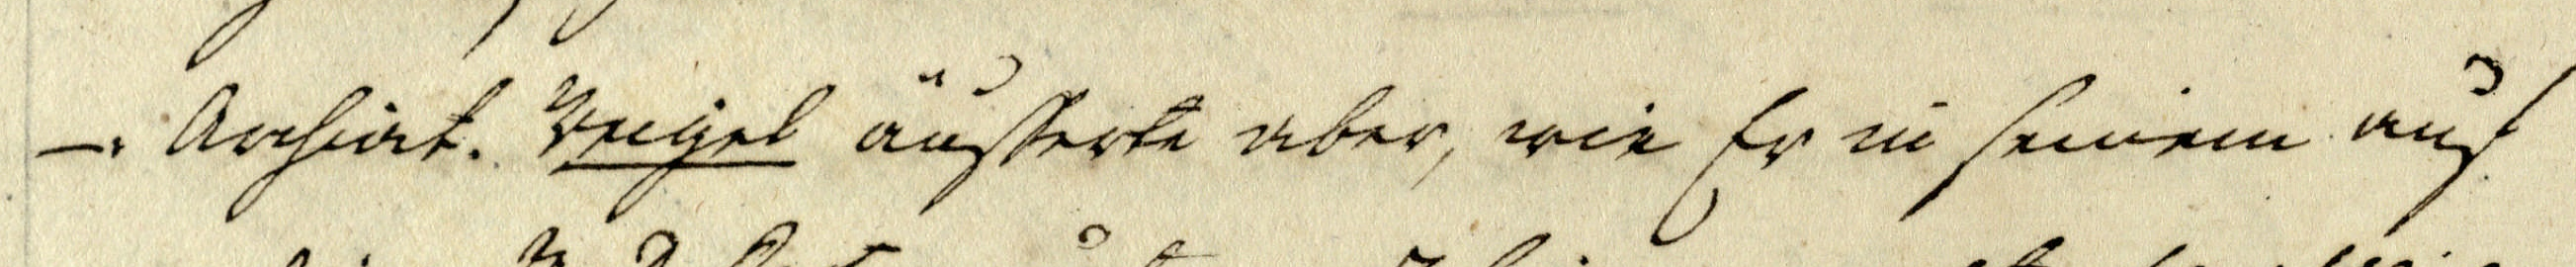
Archiat. Weigel äusserte aber, wie Er in seinem auf
